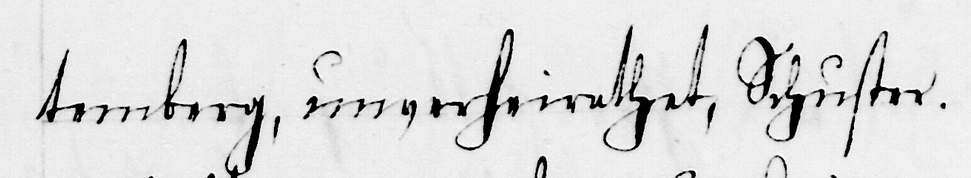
temberg, unverheirathet, Schuster.
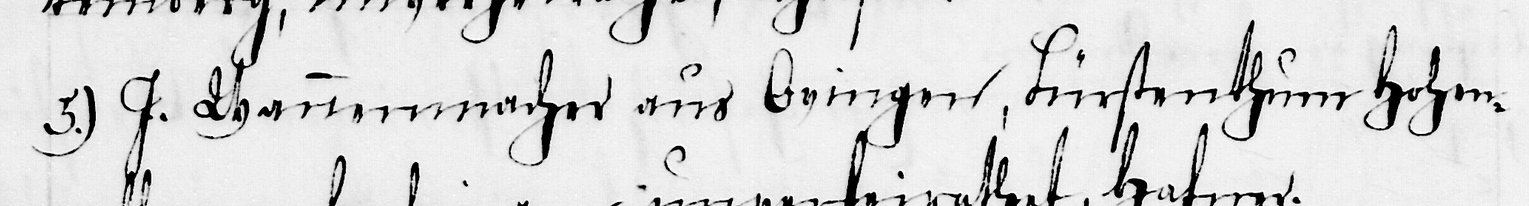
5.) J. Wannenmacher aus Ovingen, Fürstenthum Hohen¬
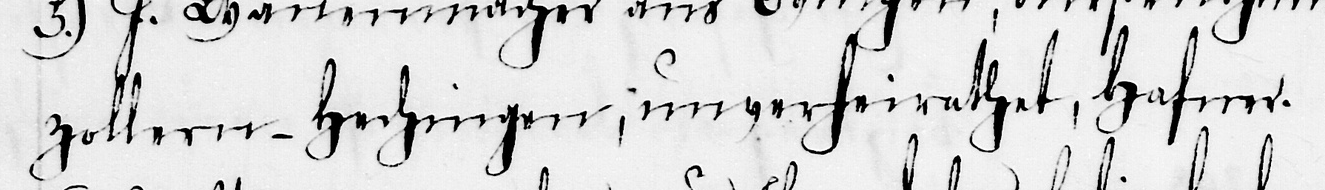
zollern-Hechingen; unverheirathet, Hafner.
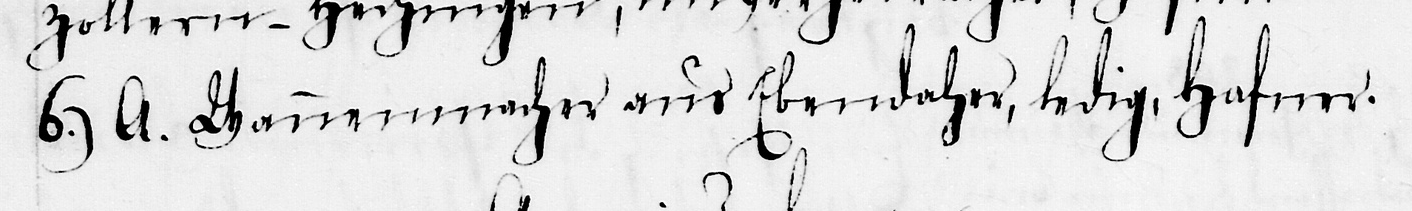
6.) A. Wannenmacher aus Ebendaher, ledig, Hafner.
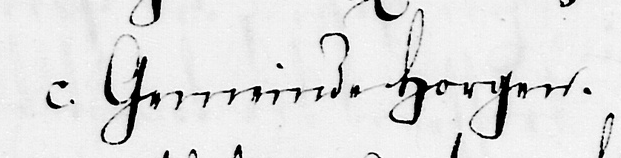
c. Gemeinde Horgen.
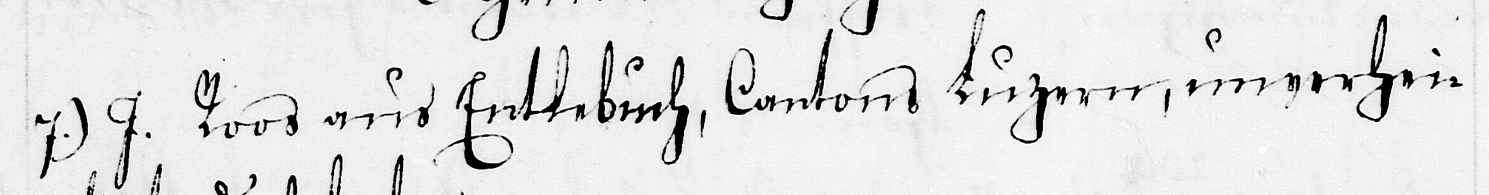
7.) J. Roos aus Entlebuch, Cantons Luzern, unverhei¬
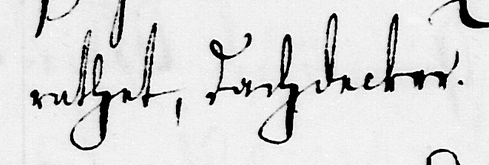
rathet, Dachdecker.
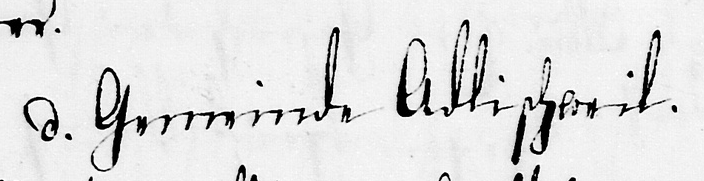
d. Gemeinde Adlischweil.
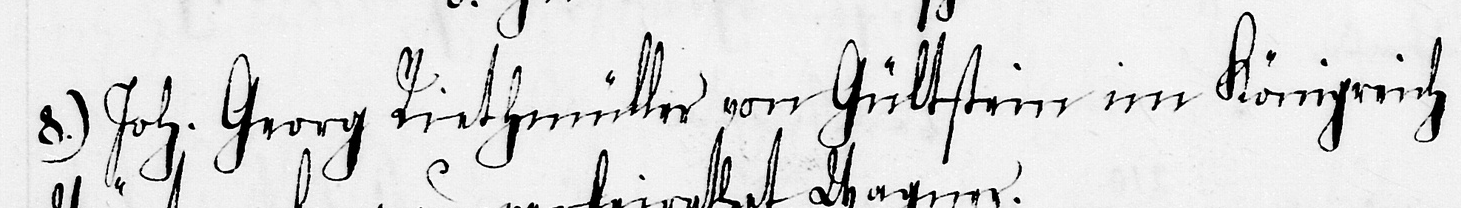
8.) Joh. Georg Riethmüller von Gültstein im Königreich
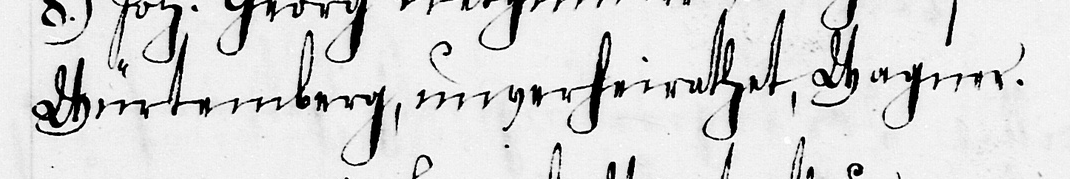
Würtemberg, unverheirathet, Wagner.
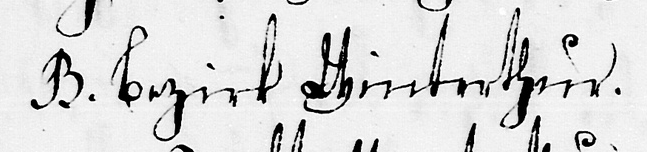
B. Bezirk Winterthur.
